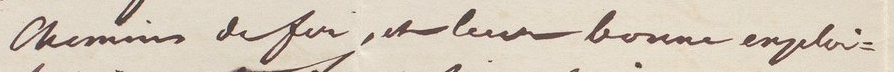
Chemins de fer, et leur bonne exploi-
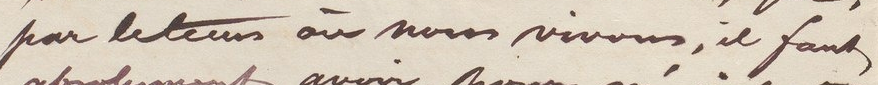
par le tems où nous vivons, il faut
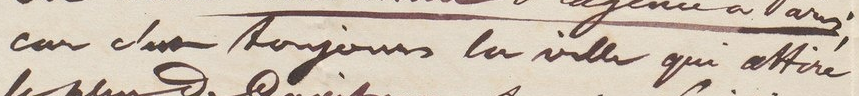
car c'est toujours la ville qui attire
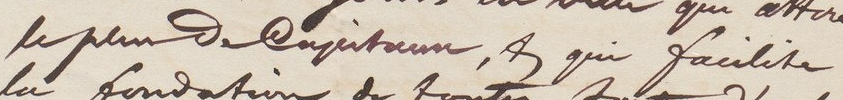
le plus de Capitaux, & qui facilite
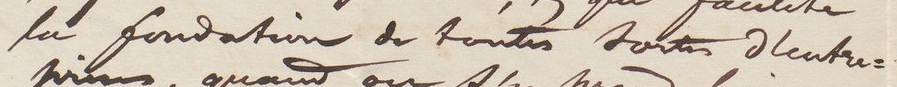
la fondation de toutes sortes d'entre-
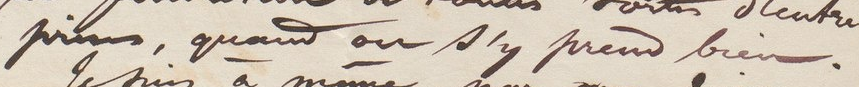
prises, quand on s'y prend bien.
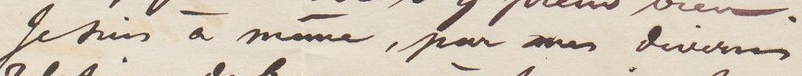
Je suis à même, par mes diverses
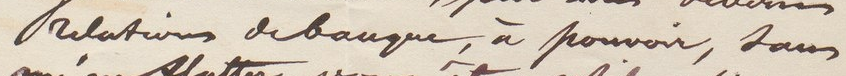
relations de banque, à pouvoir, sans
